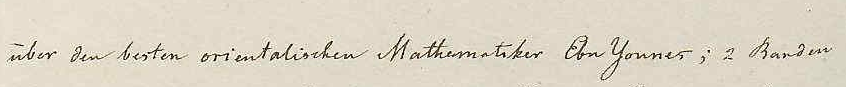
über den besten orientalischen Mathematiker Ebn Younes; 2 Banden
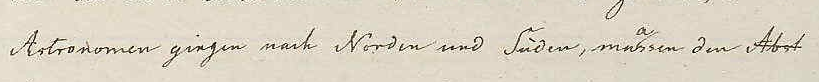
Astronomen gingen nach Norden und Süden, maassen den Abst
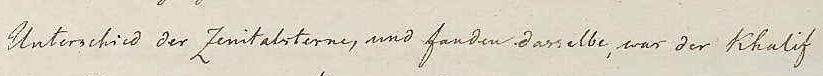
Unterschied der Zenitalsterne, und fanden dasselbe, was der Khalif
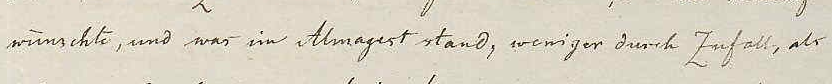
wünschte, und was im Almagest stand, weniger durch Zufall, als
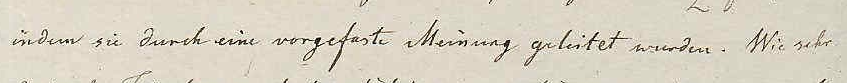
indem sie durch eine vorgefaste Meinung geleitet wurden. Wie sehr
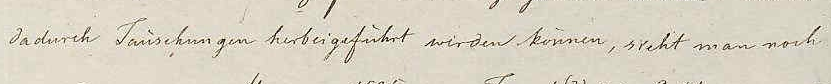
dadurch Täuschungen herbeigeführt werden können, sieht man noch
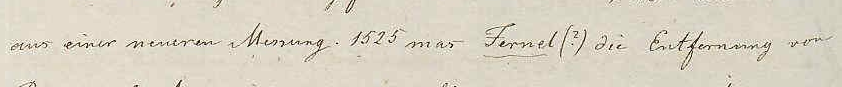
aus einer neueren Messung. 1525 mas Fernel die Entfernung von
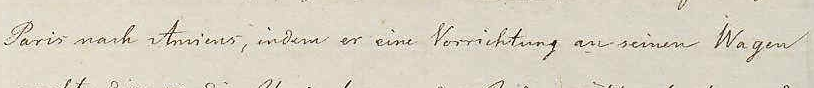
Paris nach Amiens, indem er eine Vorrichtung an seinen Wagen
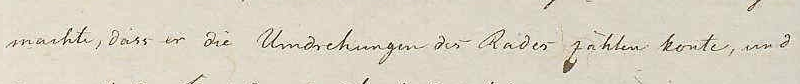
machte, dass er die Umdrehungen des Rades zählen konte, und
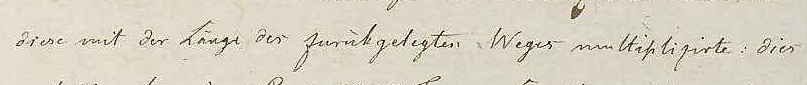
diese mit der Länge des zurükgelegten Weges multiplizirte: dies
